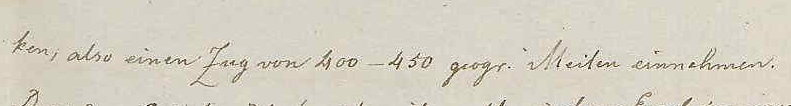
ken, also einen Zug von 400–450 geogr. Meilen einnehmen.
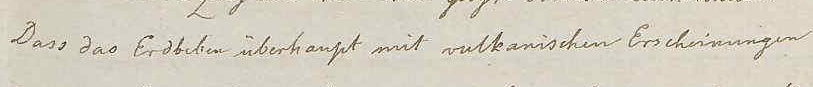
Dass das Erdbeben überhaupt mit vulkanischen Erscheinungen
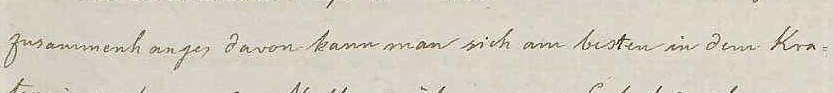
zusammenhange, davon kann man sich am besten in dem Kra-
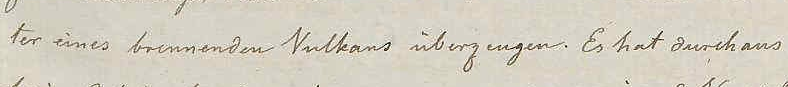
ter eines brennenden Vulkans überzeugen. Es hat durchaus
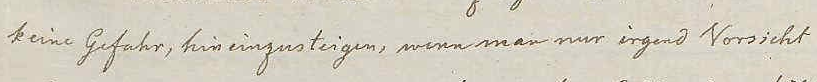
keine Gefahr, hineinzusteigen, wenn man nur irgend Vorsicht
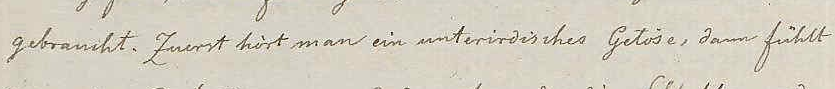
gebraucht. Zuerst hört man ein unterirdisches Getöse, dann fühlt
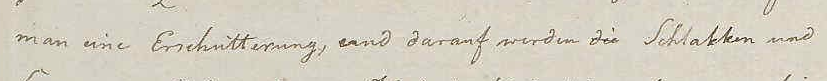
man eine Erschütterung, und darauf werden die Schlakken und
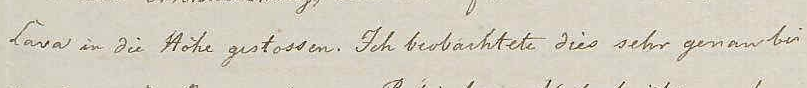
Lava in die Höhe gestossen. Ich beobachtete dies sehr genau bei
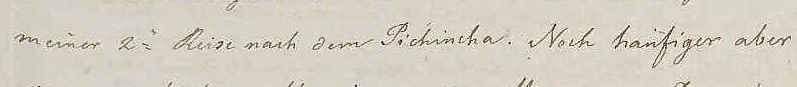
meiner 2￼ Reise nach dem Pichincha. Noch häufiger aber
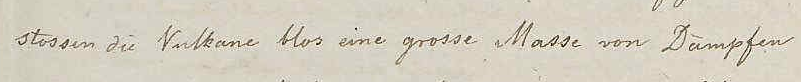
stossen die Vulkane blos eine grosse Masse von Dämpfen
